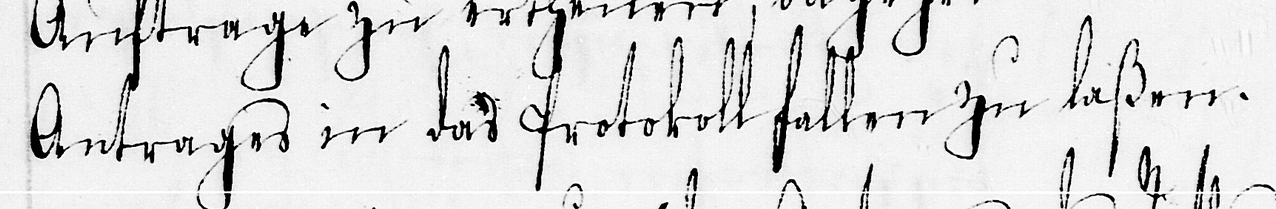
Antrages in das Protokoll fallen zu laßen.
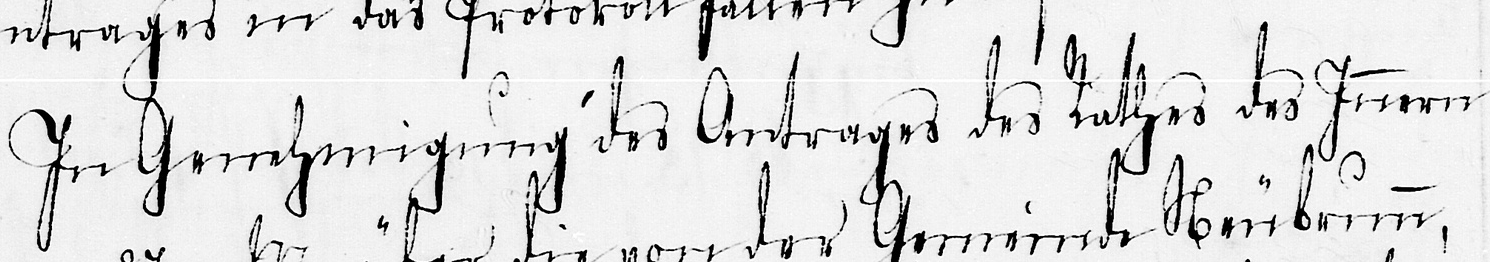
In Genehmigung des Antrages des Rathes des Inne¬
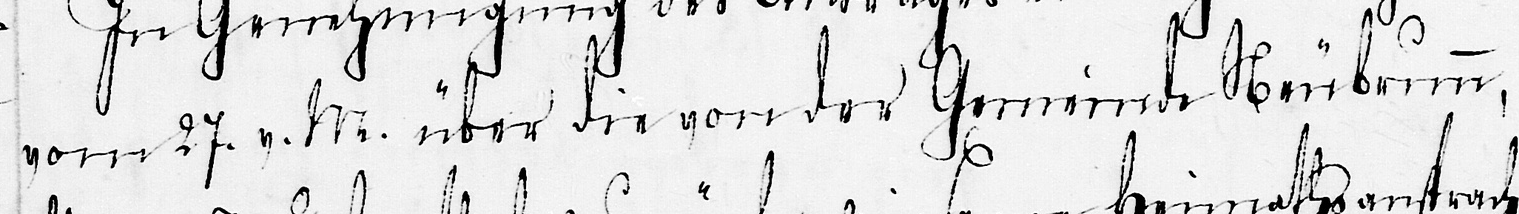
vom 27. v. M. über die von der Gemeinde Neubrunn,
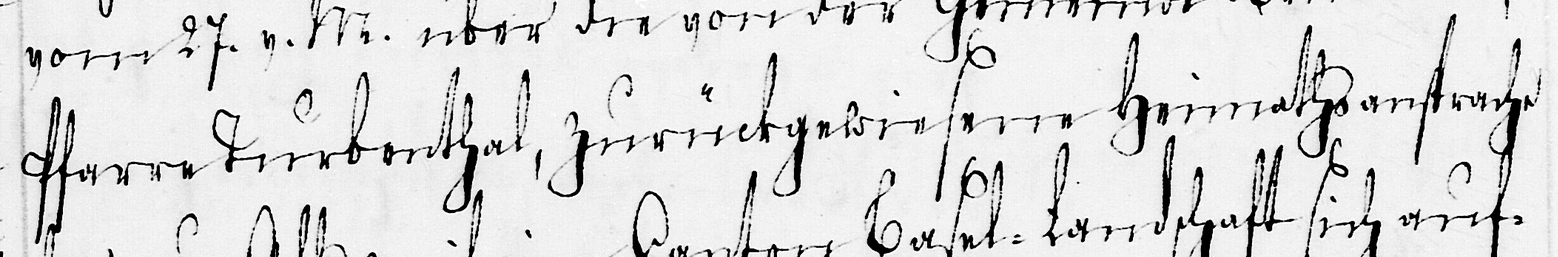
Pfarre Turbenthal, zurückgewiesene Heimathsansprache
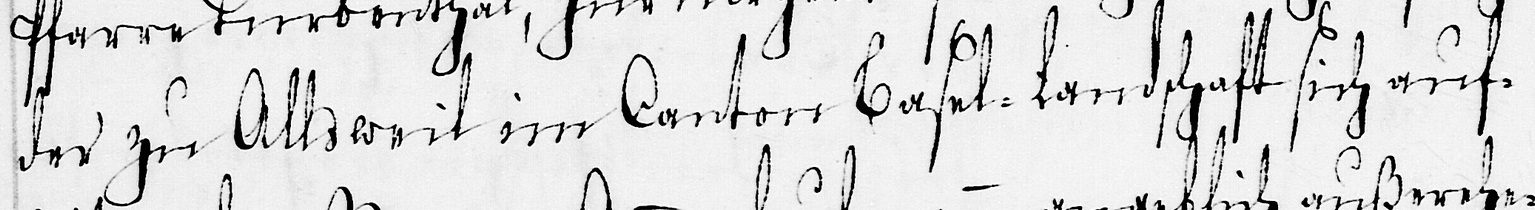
der zu Allsweil im Canton Basel-Landschaft sich auf¬
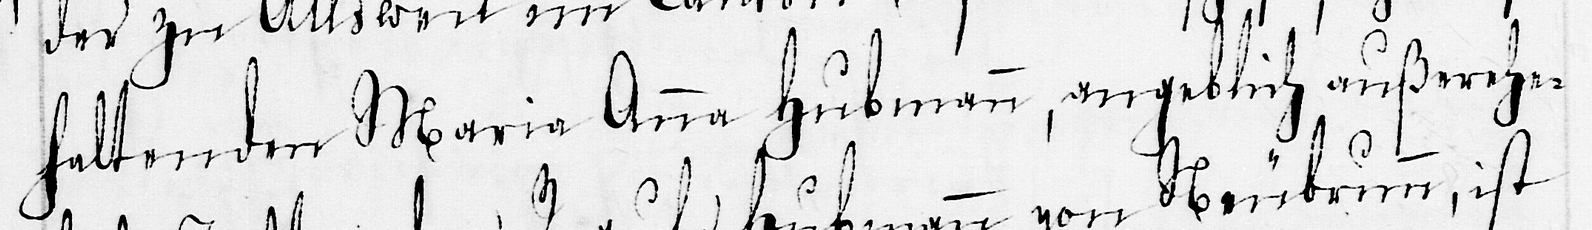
haltenden Maria Anna Hubmann, angeblich außerehe¬
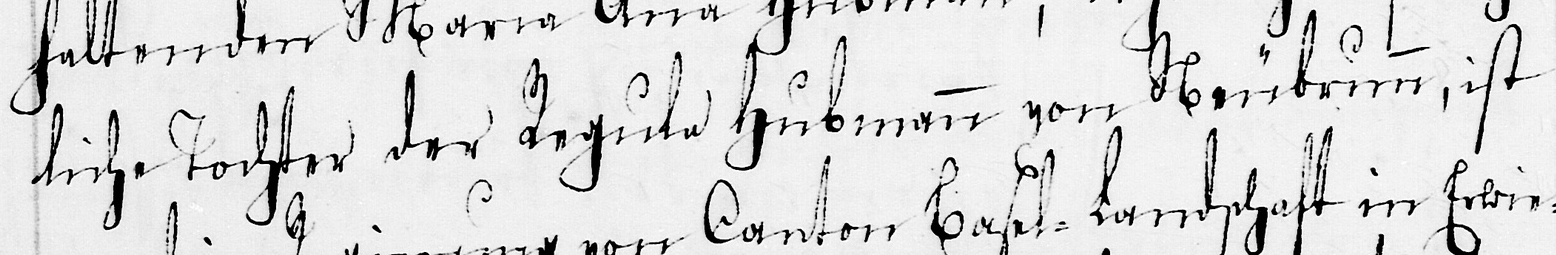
liche Tochter der Regula Hubmann von Neubrunn, ist
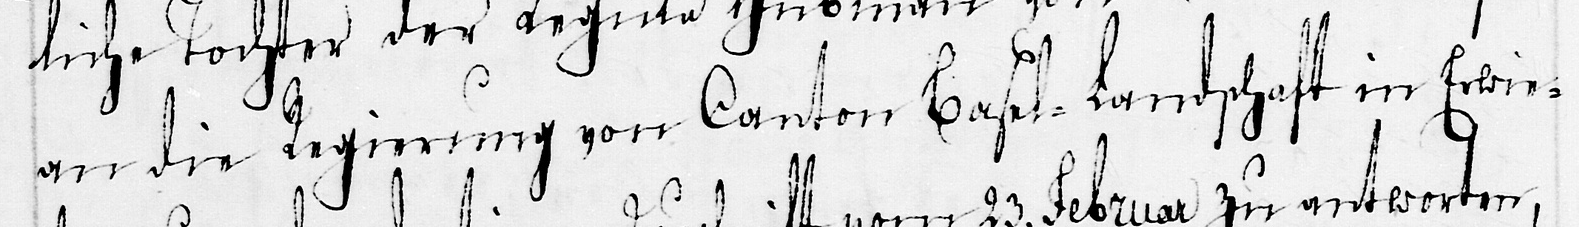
an die Regierung von Canton Basel-Landschaft in Erwie¬
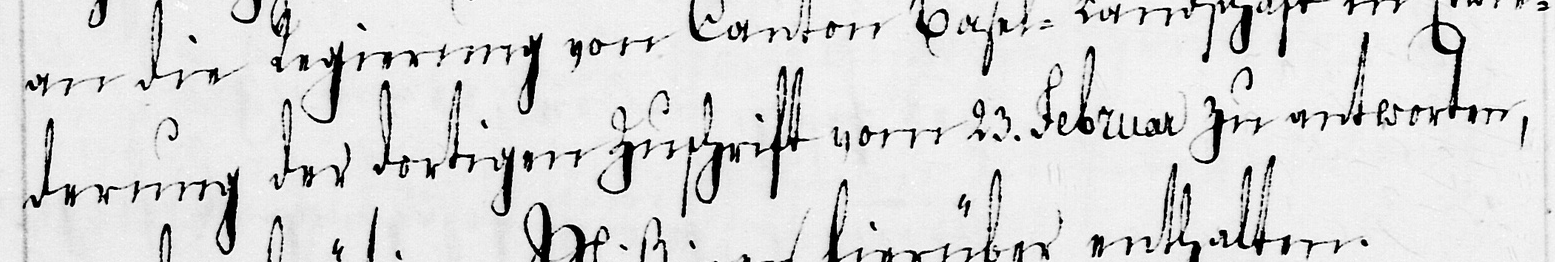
derung der dortigen Zuschrift vom 23. Februar zu antworten,
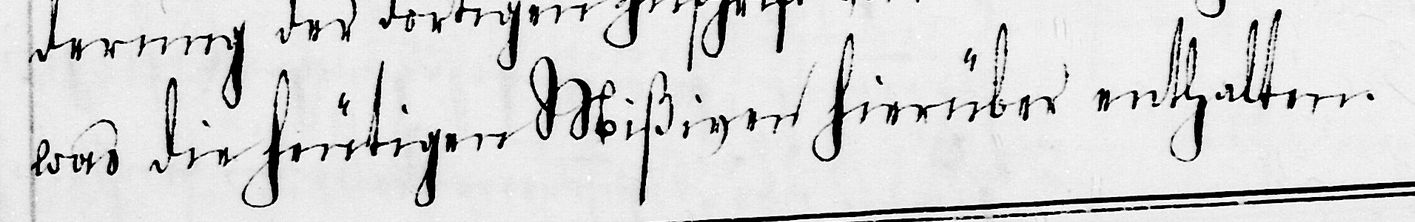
was die heutigen Mißiven hierüber enthalten.
